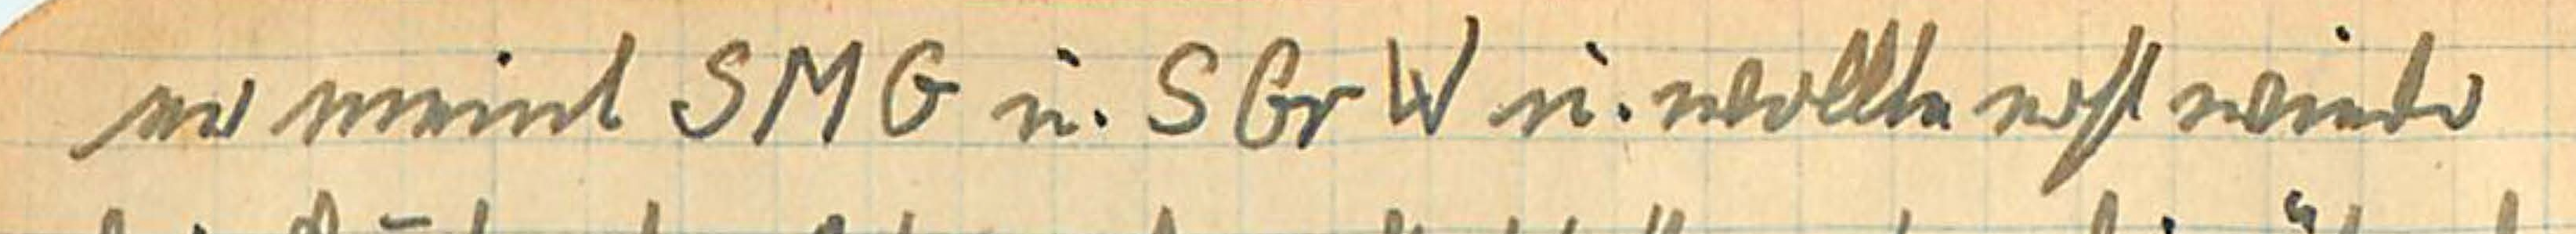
er meint SMG u. SGrW u. wollte erst wieder
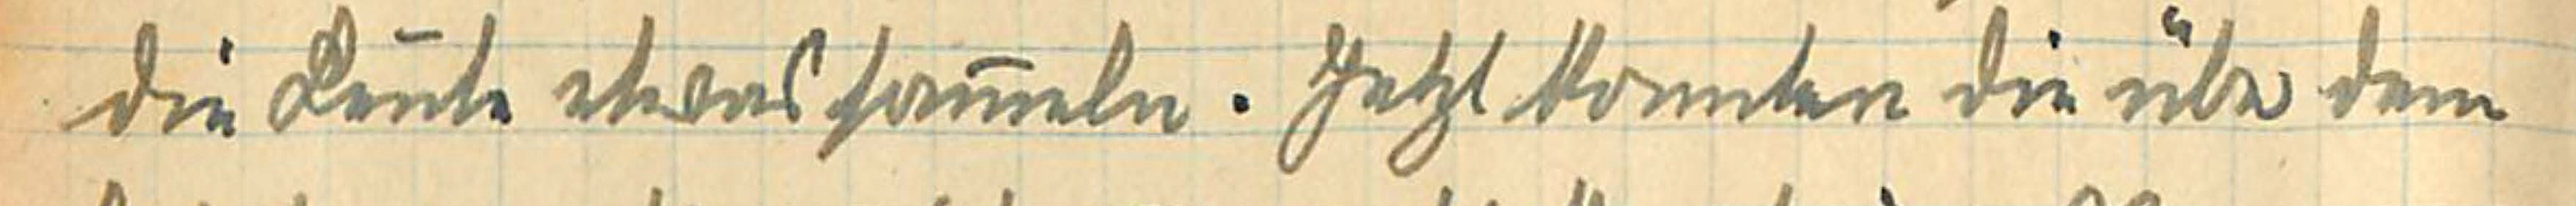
die Leute etwas sammeln. Jetzt konnten die über dem
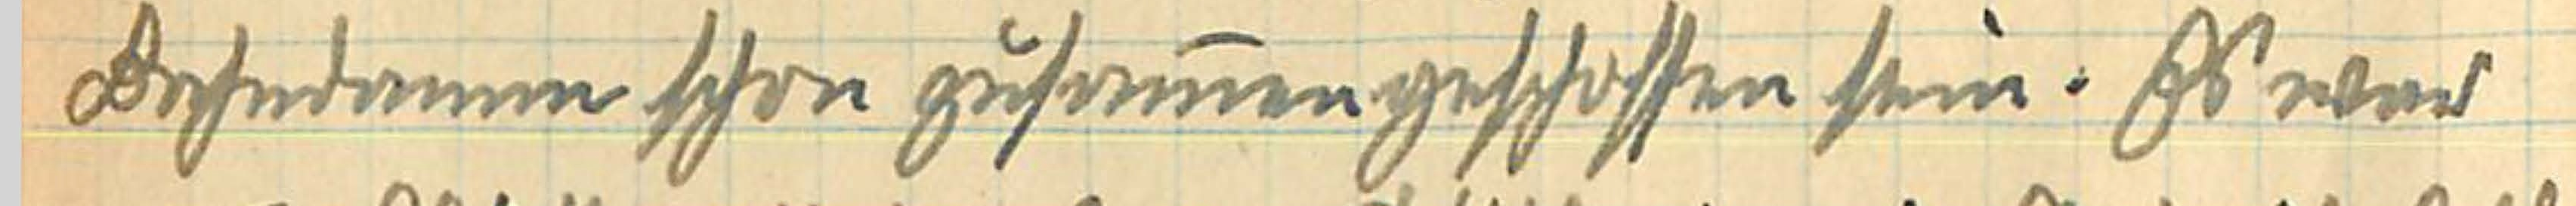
Bahndamm schon zusammengeschossen sein. Es war
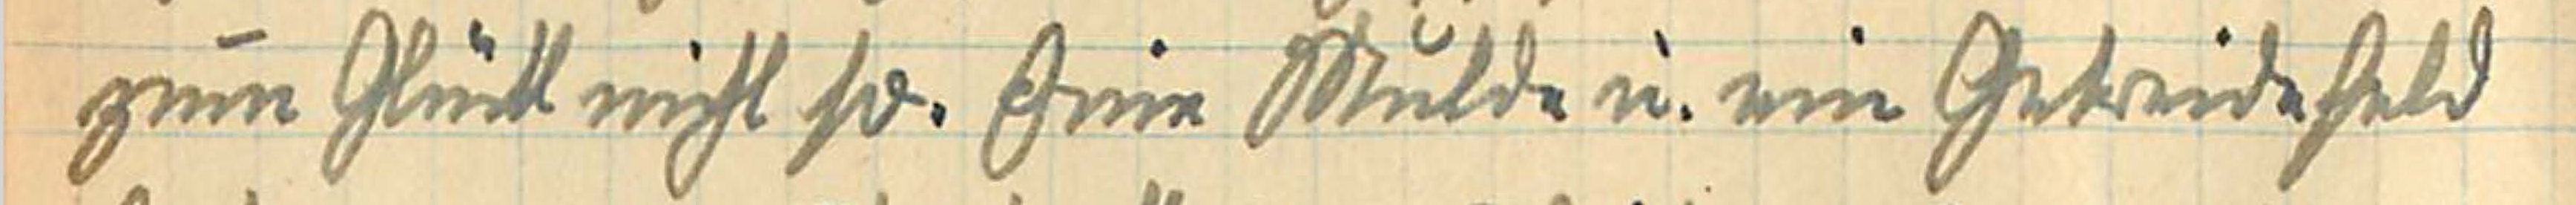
zum Glück nicht so. Eine Mulde u. ein Getreidefeld
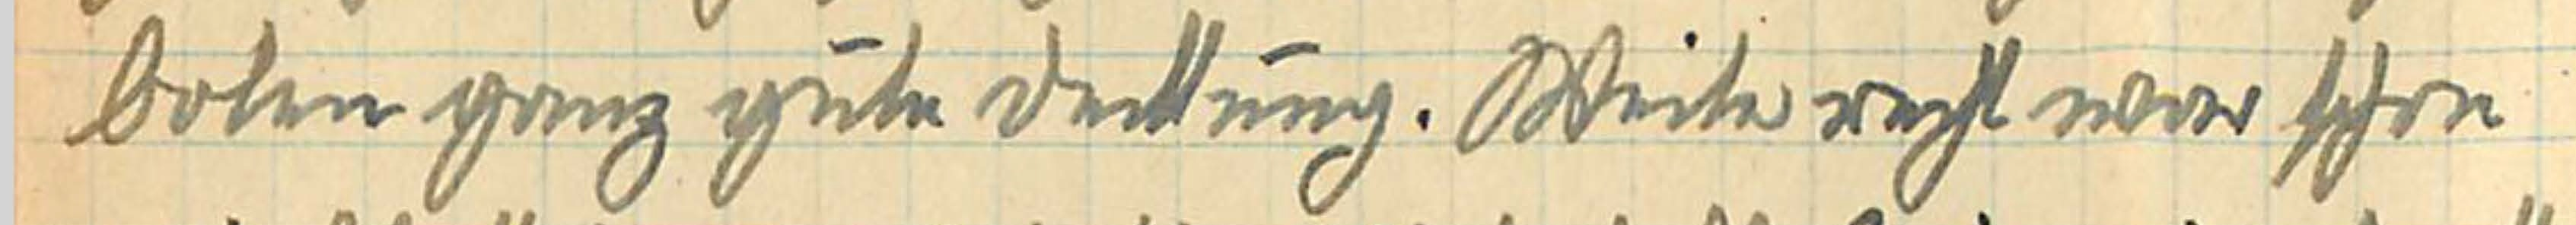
boten ganz gute Deckung. Weiter recht war schon
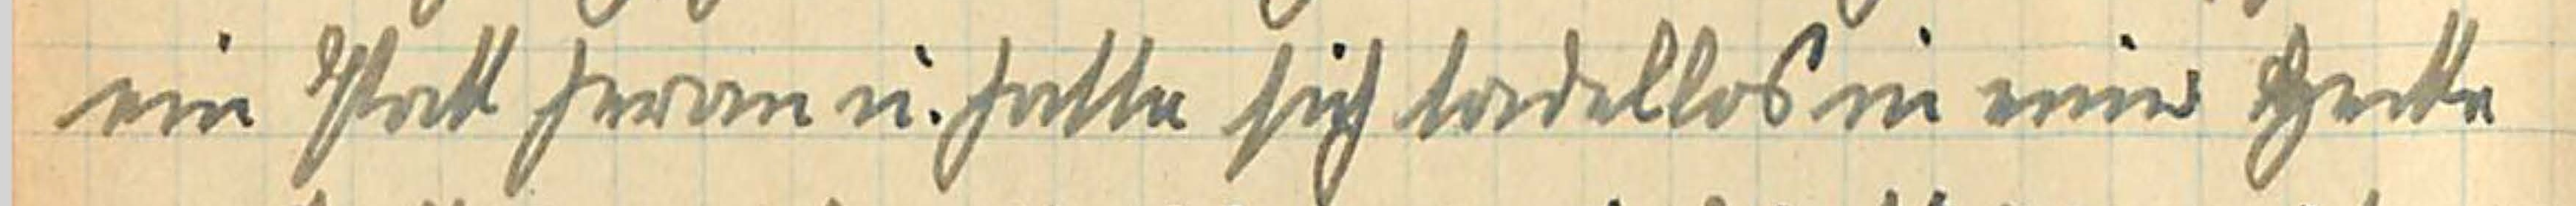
ein Pak heran u. hatte sich tadellos in einer Hecke
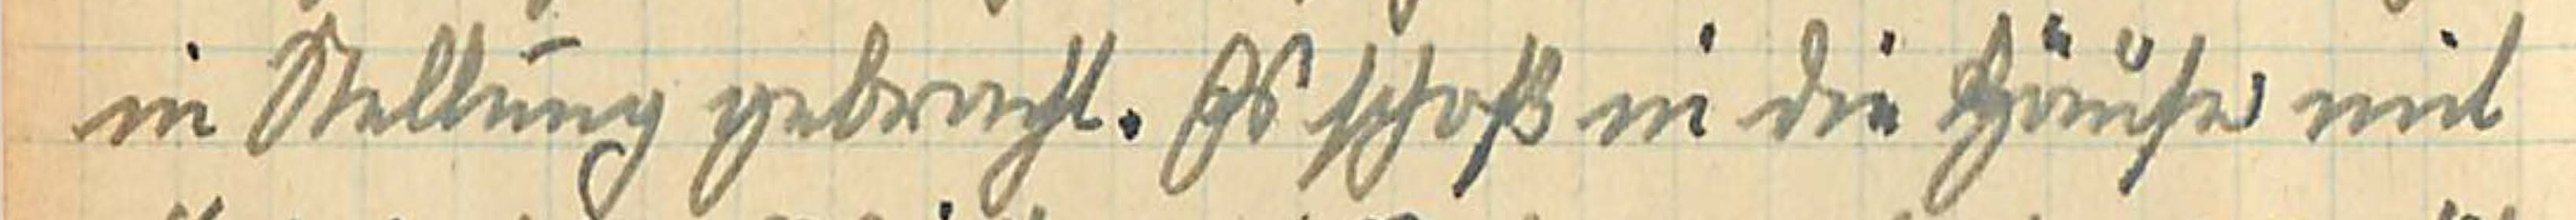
in Stellung gebracht. Es schoß in die Häuser mit
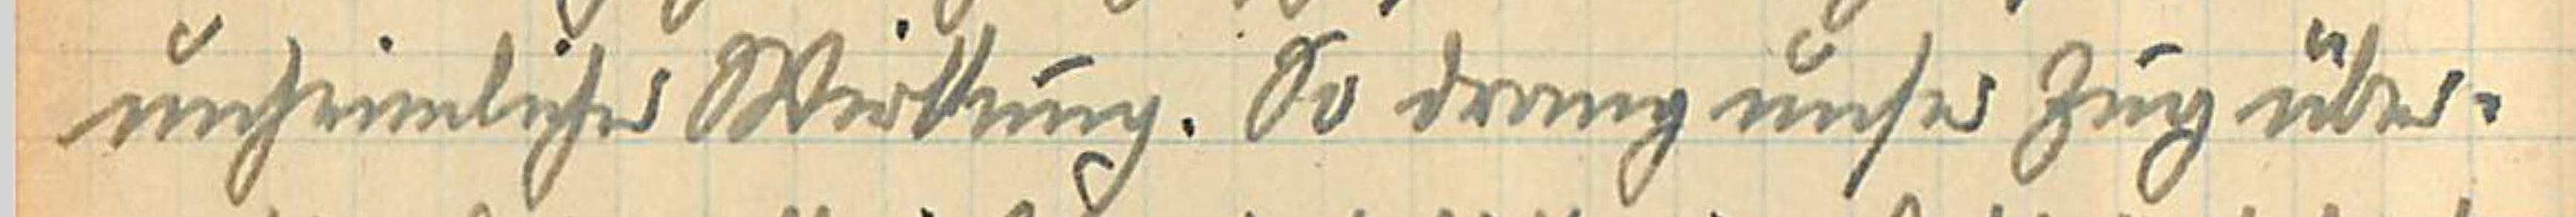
unheimlicher Wirkung. So drang unser Zug über-
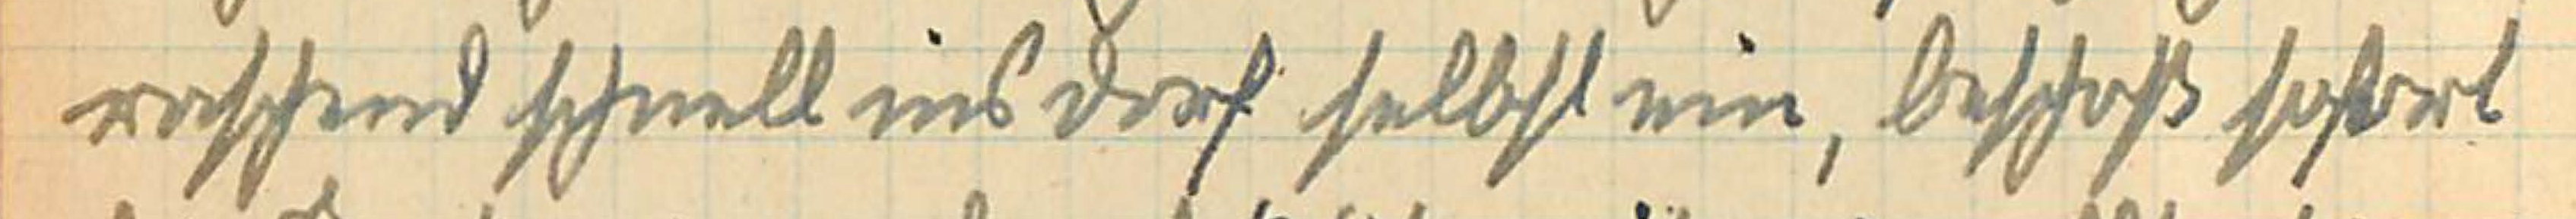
raschend schnell ins Dorf selbst ein, beschoß sofort
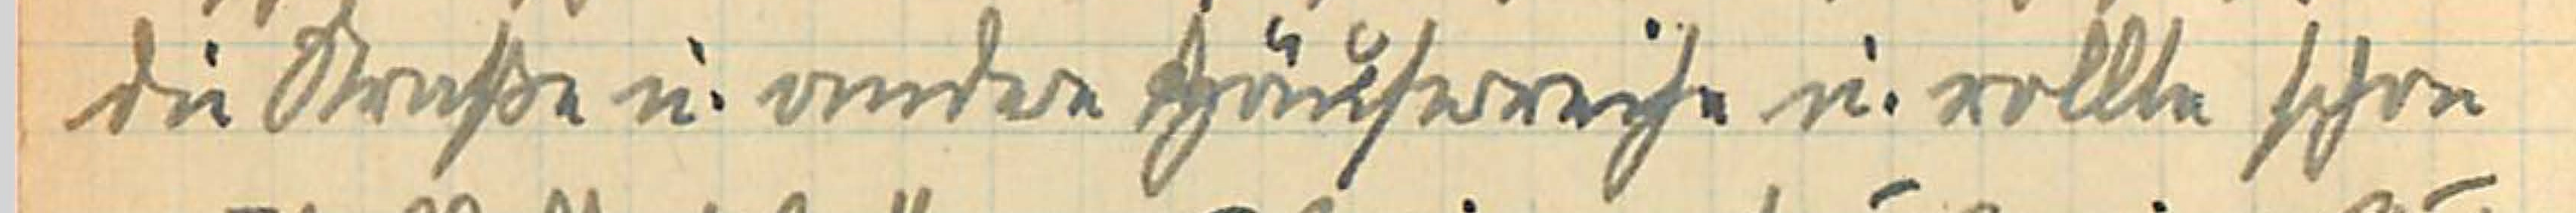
die Straße u. andere Häuserreihe u. rollte schon
